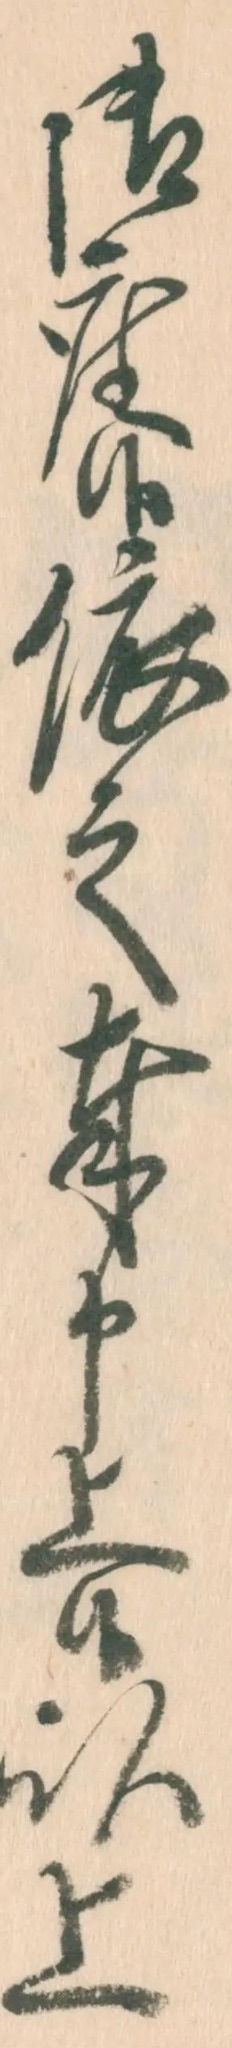御座候依之奉申上候以上
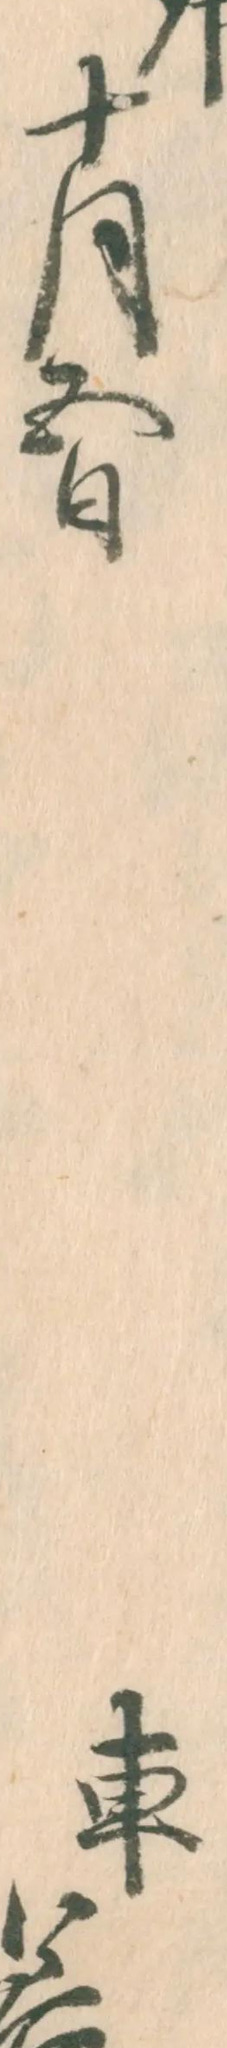十月五日善七

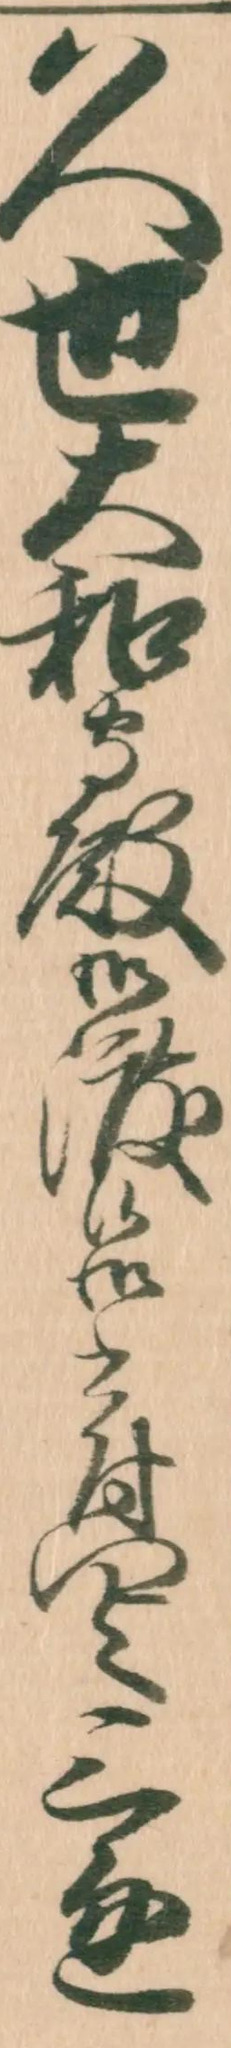│久世大和守殿御渡候御書付写三通
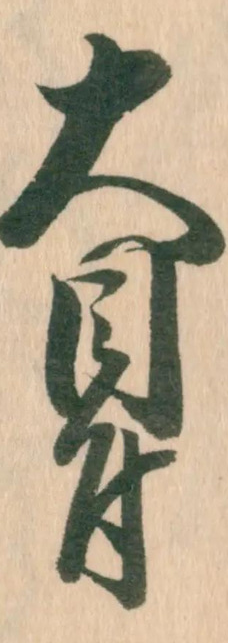│大目付
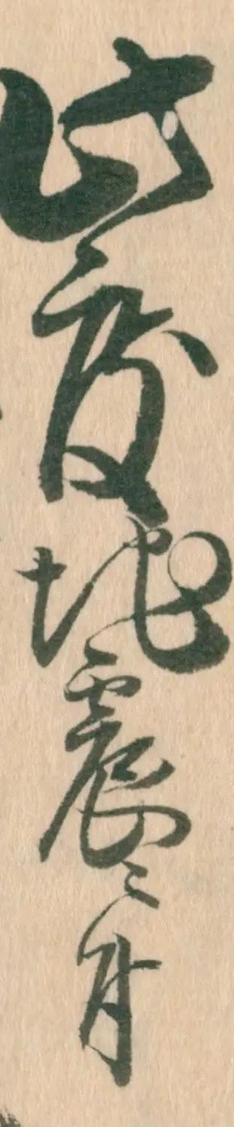此度地震ニ付
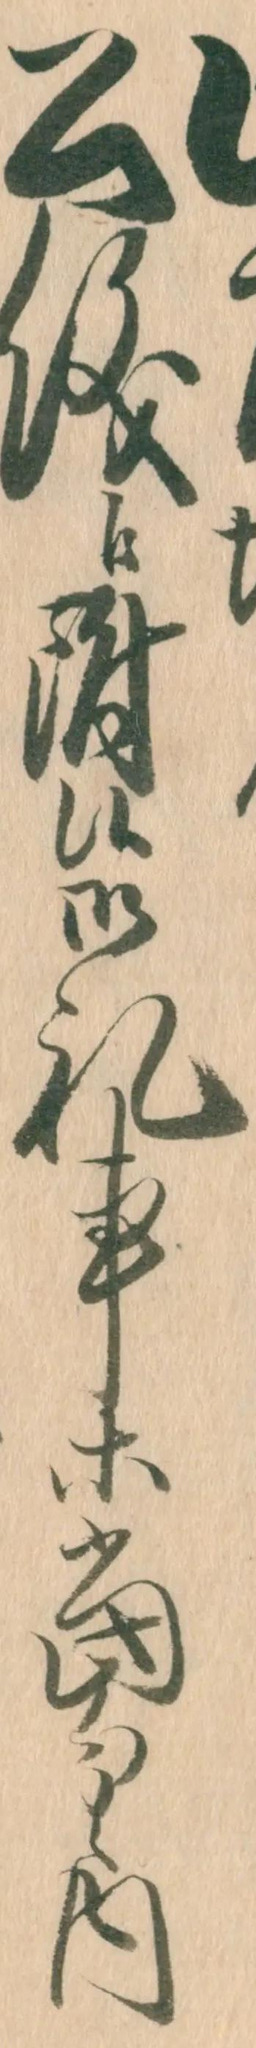公儀え附候御礼事等当分之内
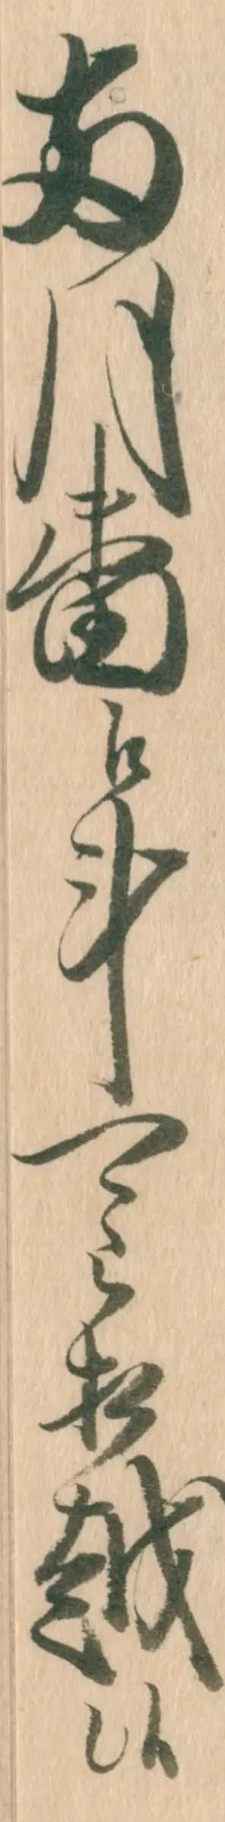両月番え計可被相越候

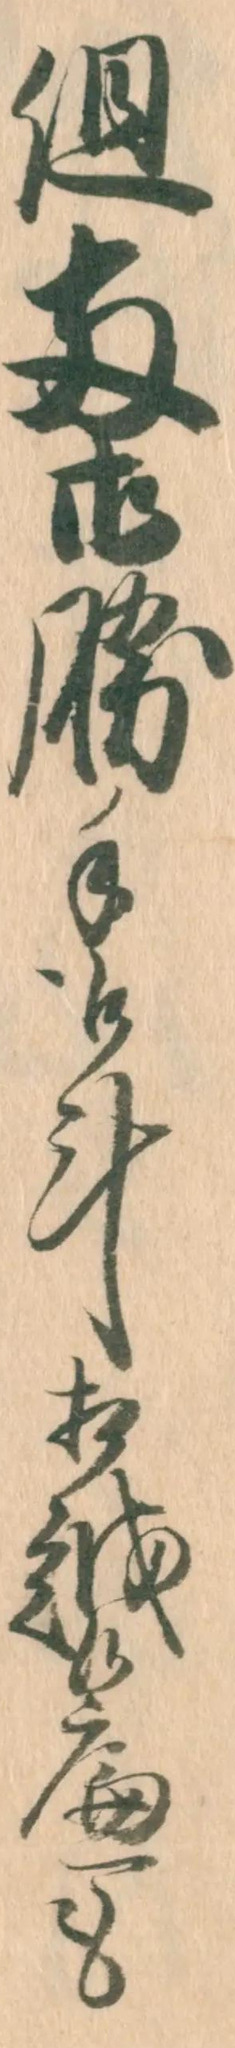但両御勝手え計相越候廉も
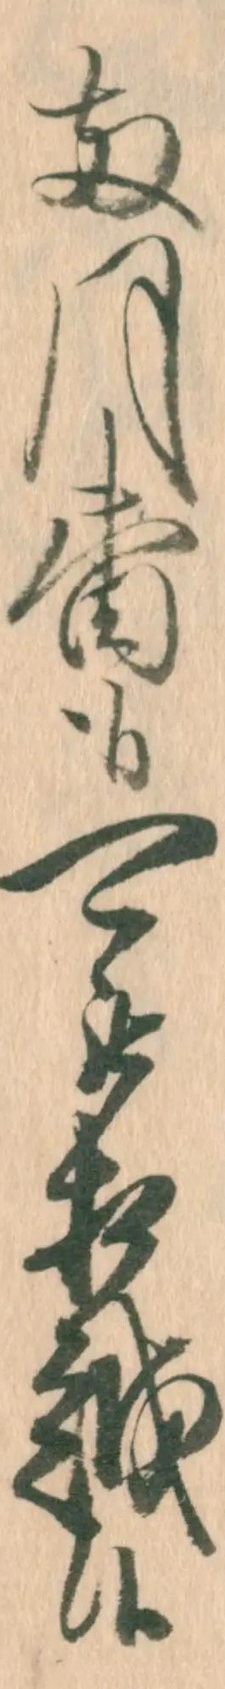両月番え可被相越候
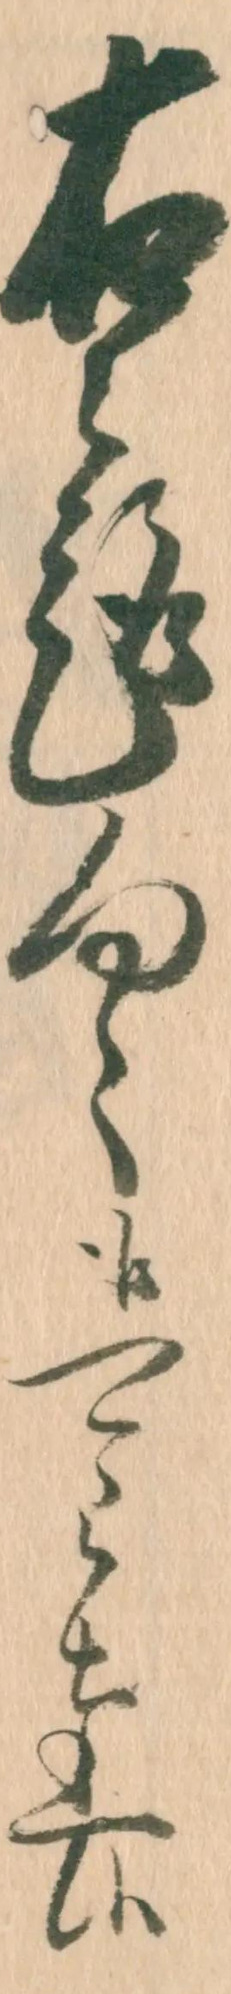右之趣向〻え可被達候
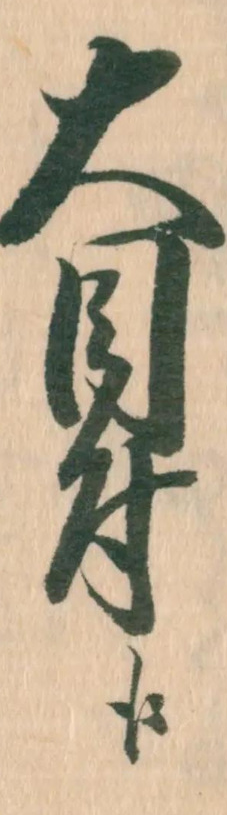│大目付え
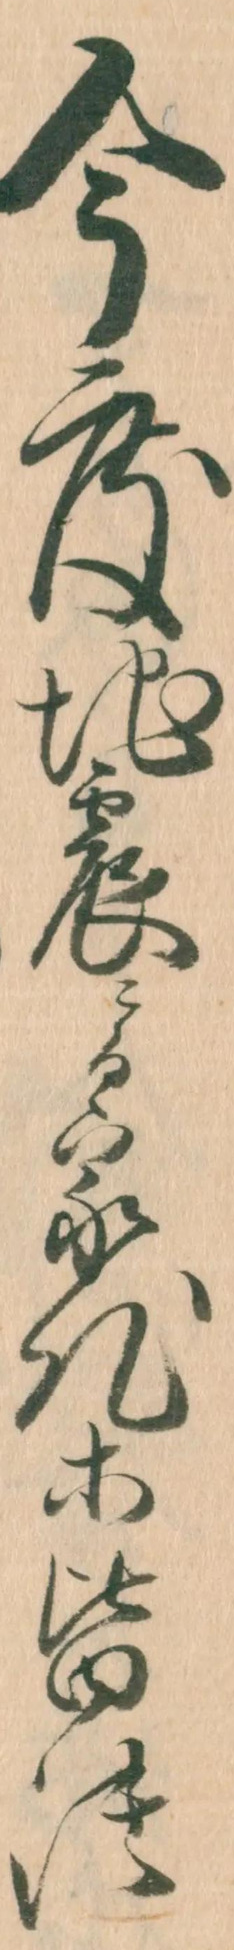今度地震ニて家作等皆潰
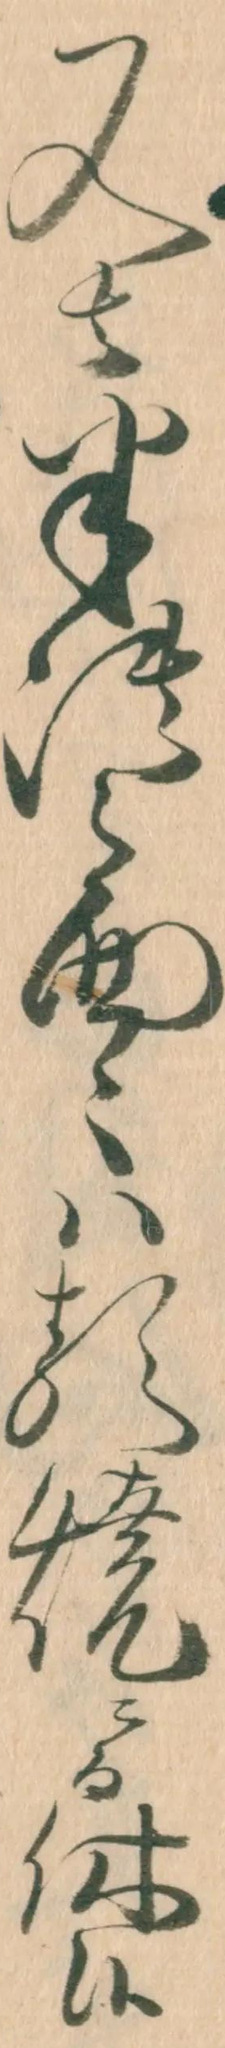又は半潰之面〻ハ類焼ニて休候
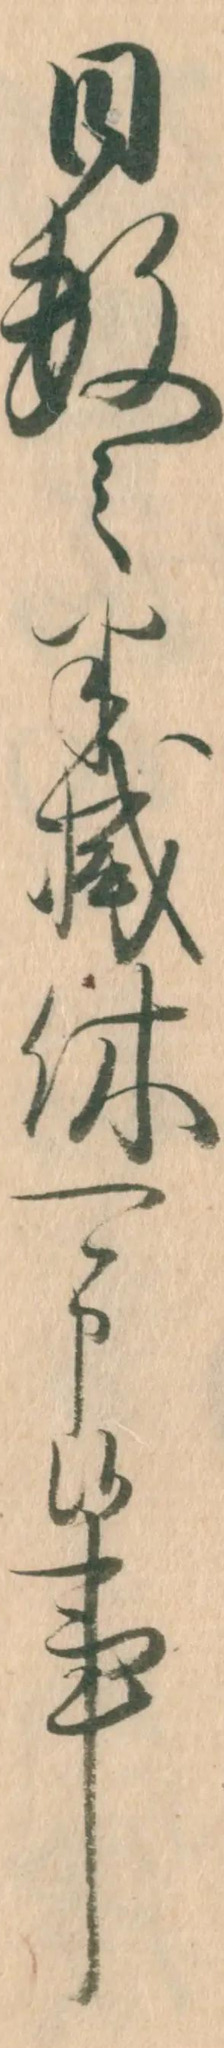日数之半減休可申候事

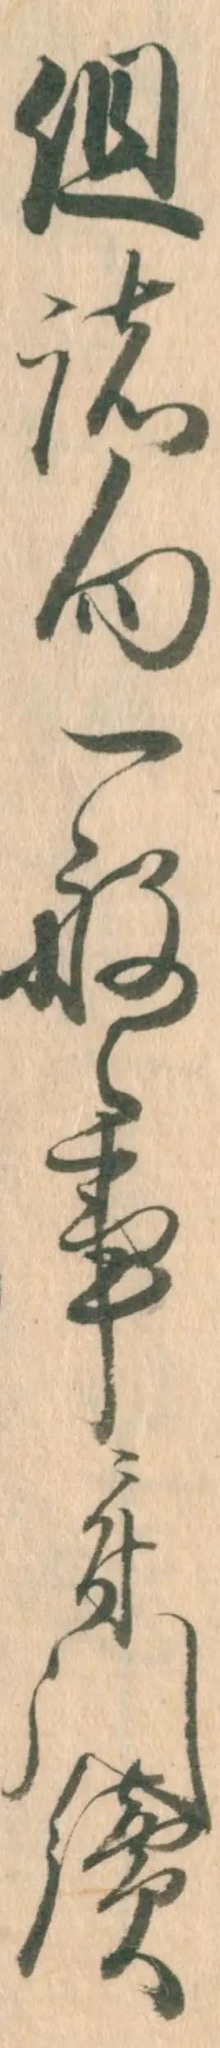但諸向一般之事ニ付引続
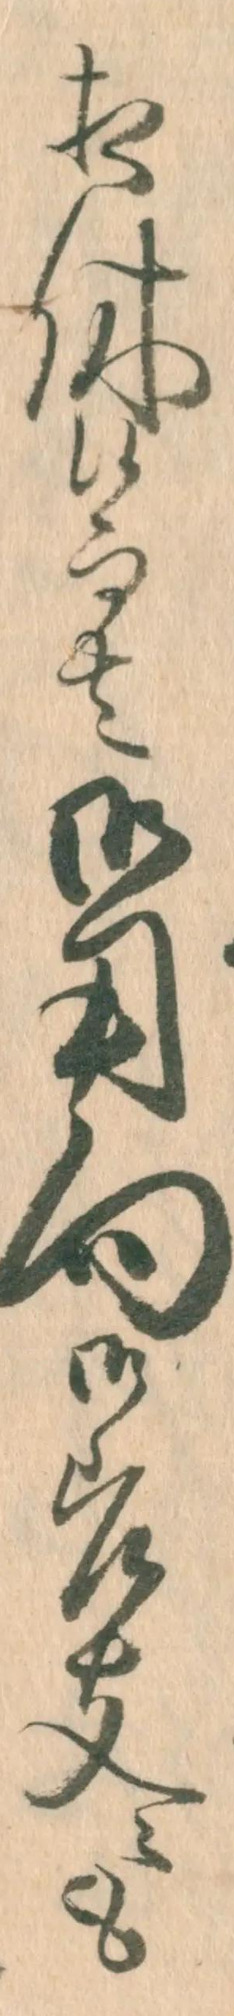相休候ては御用向御差支ニも
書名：地震災書留 2巻. [2] 内表紙に「地震一件　安政二卯年十月」とあり
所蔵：国立国会図書館 National Diet Library, JAPAN
